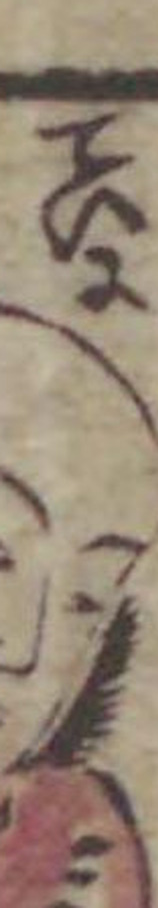ていに
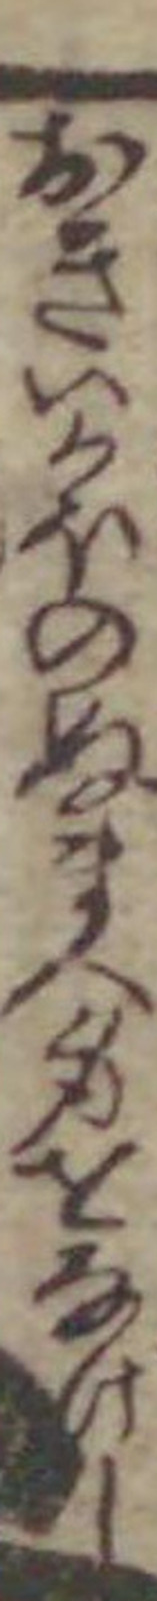おきいかほのぬまへ身をなげし
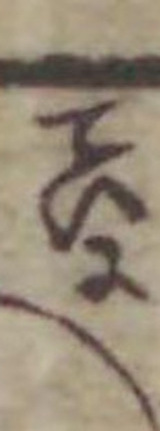ていに
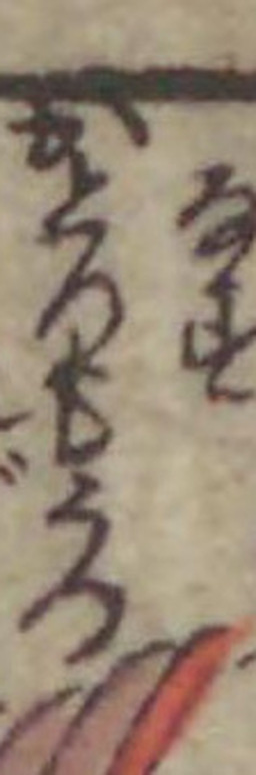かとりもうつ
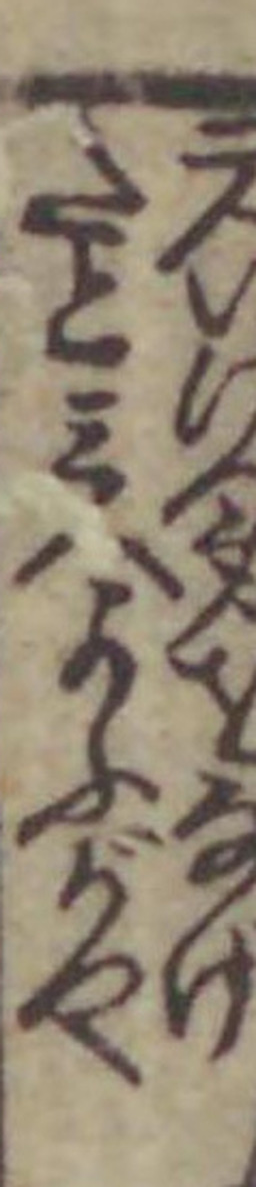たとみへよふがや
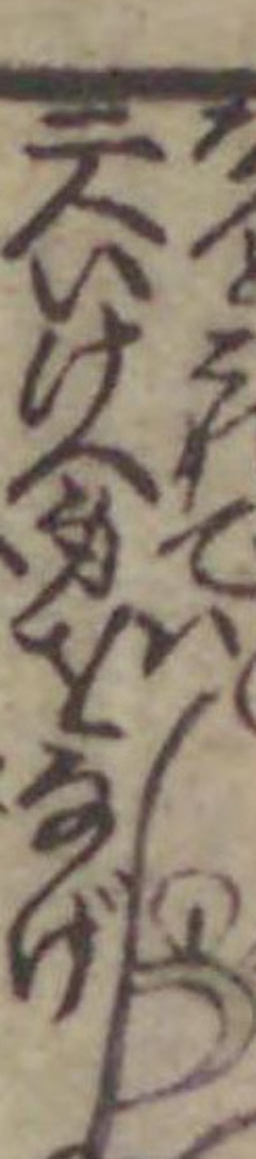二人いけへ身をなげ
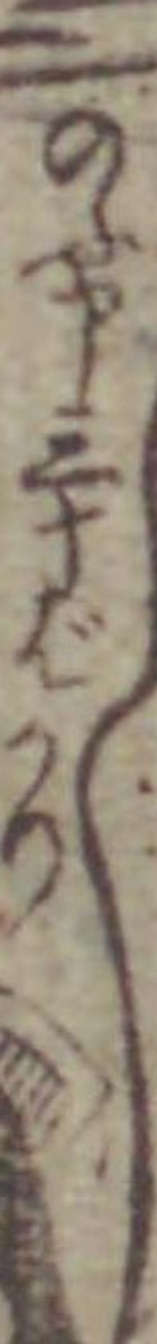のふ申三十ばかり
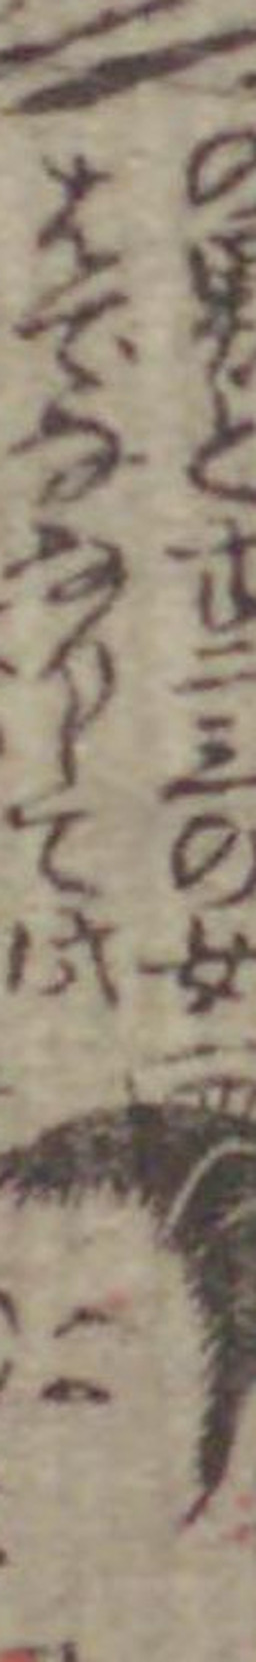はでななりして此
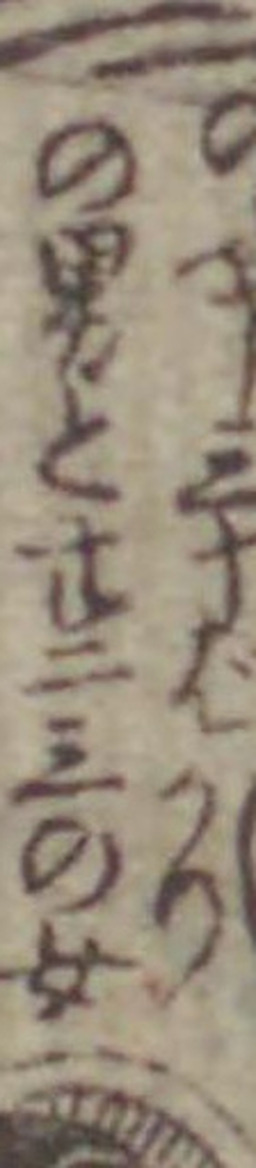の男と廿二三の女
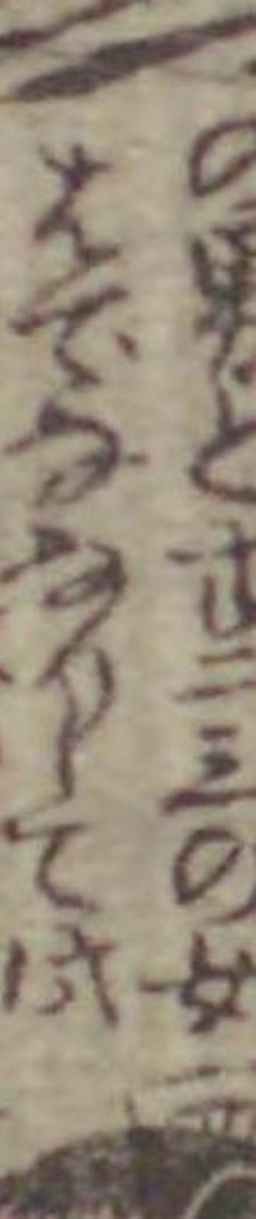はでななりして此
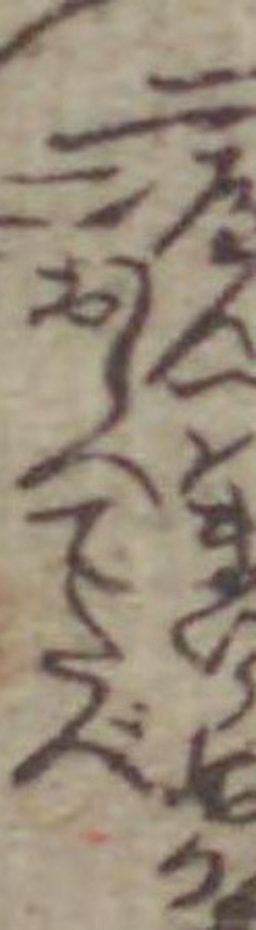おしへてたべ
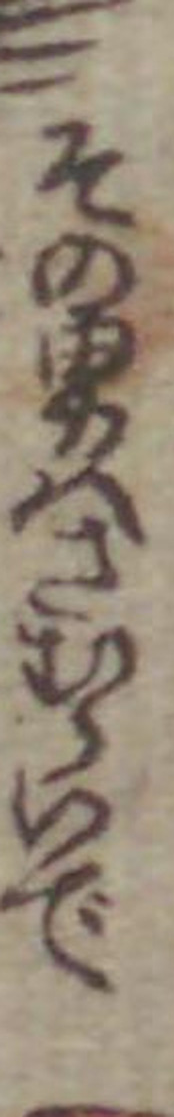その男はさむらいで
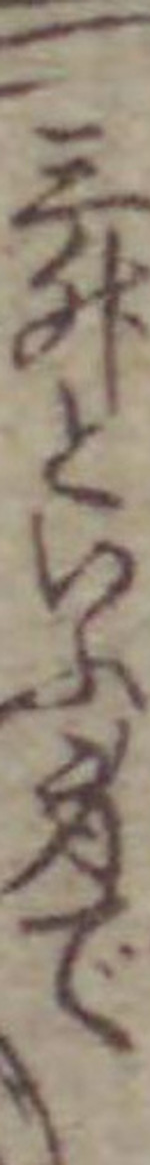三升といふ身で
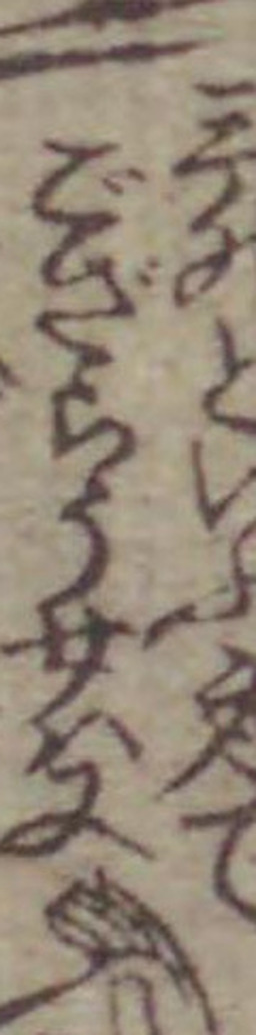ござらう女は又
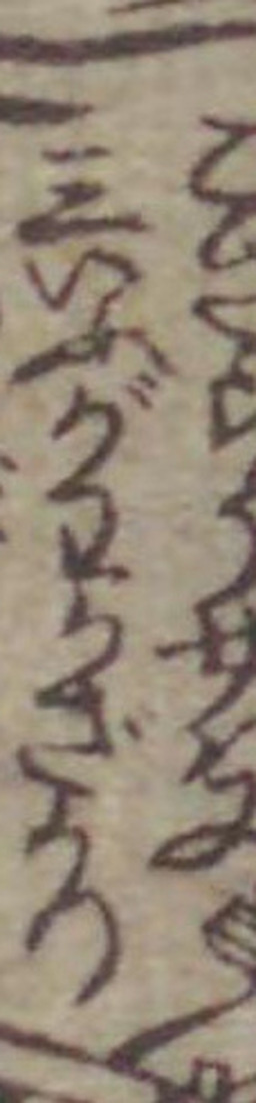三いふがわりざかり

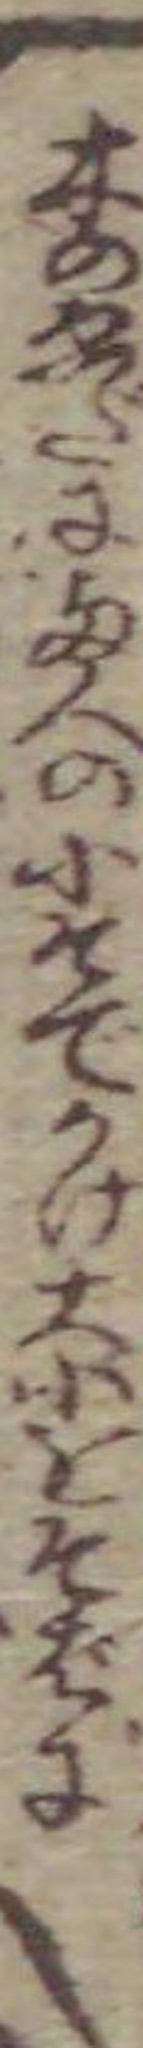木のゑだに両人の小そでかけ大小をそばに
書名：娜二代鉢木 5巻
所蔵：国立国会図書館 National Diet Library, JAPAN
